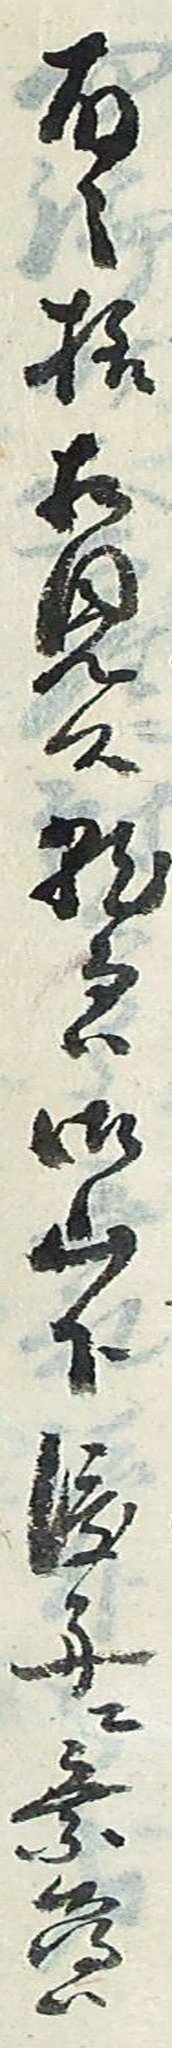有之様相見候就而は御山下渡舟に乗候得は
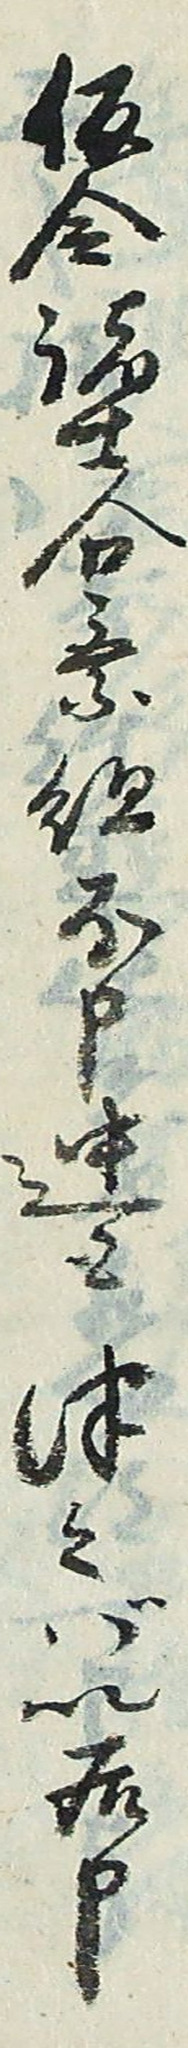仮令諸士分乗組不申迚もつくばい居申
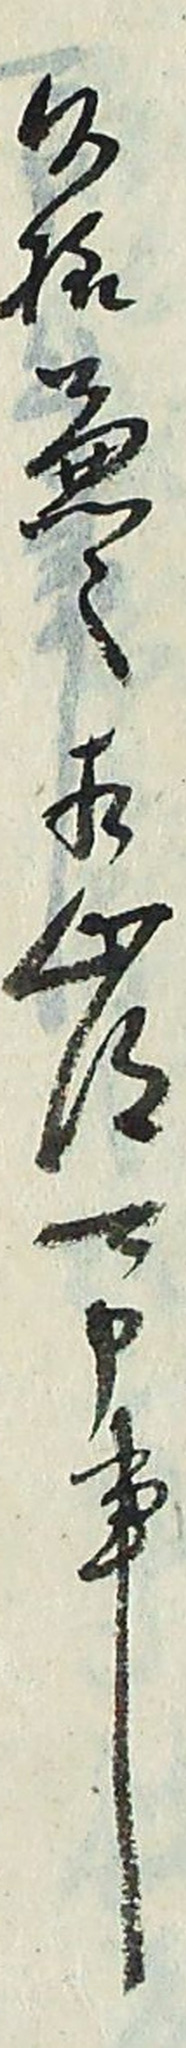候様兼々相心得可申事
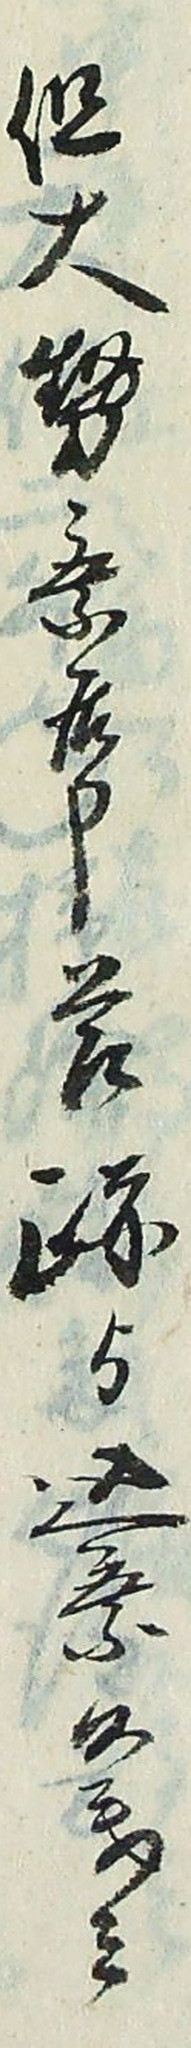但大勢乗居申節跡より込乗候義は
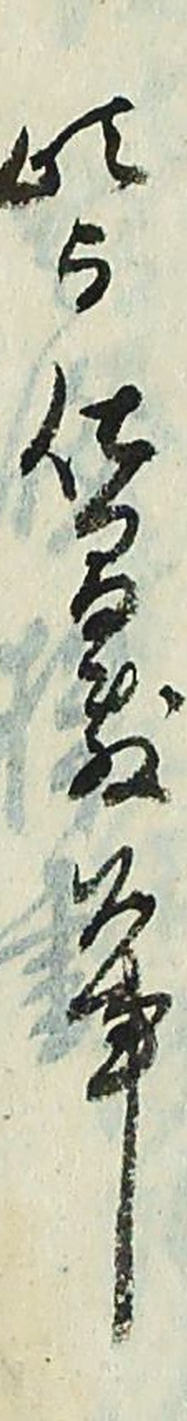屹と仕間敷候事
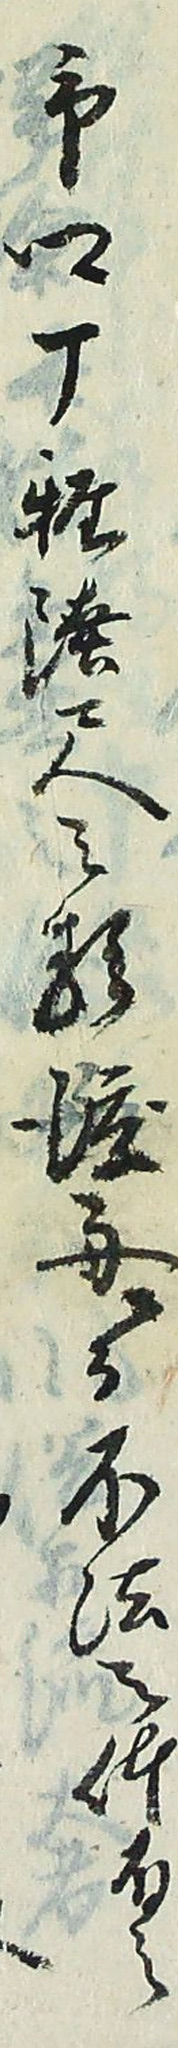市郷丁稚陸尺之類渡舟に而不法之体有之
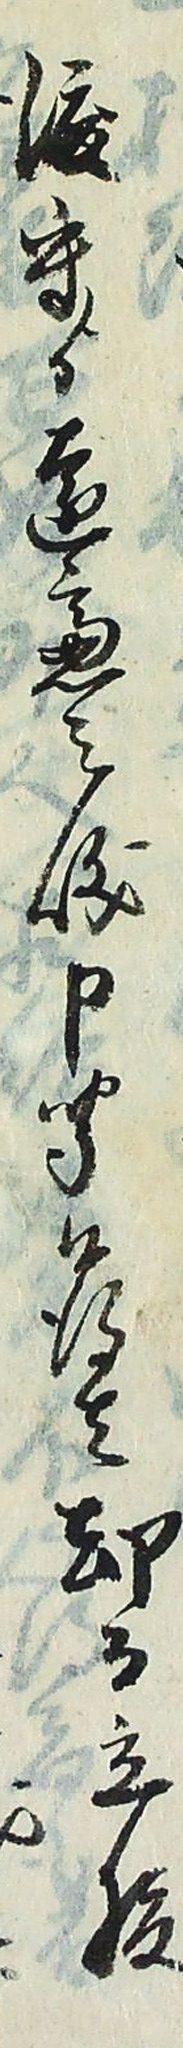渡守ゟ遠慮之儀申聞候得は却而立腹
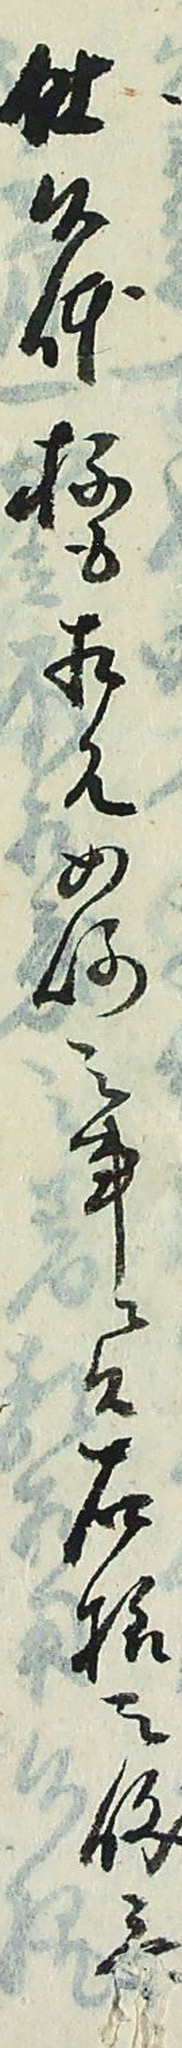仕候体抔も相見如何之事に候右様之儀無
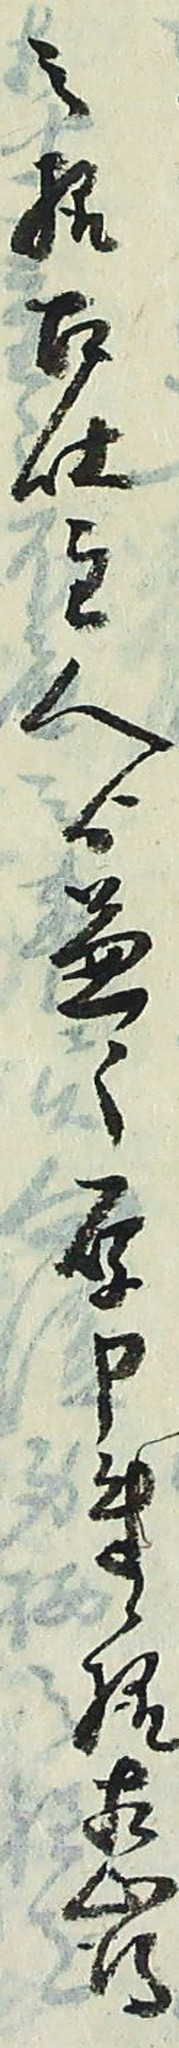之様召使主人ゟ兼々厚申付候様相心得
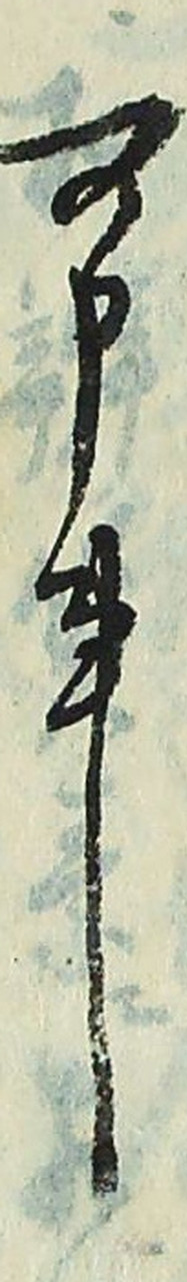可申事
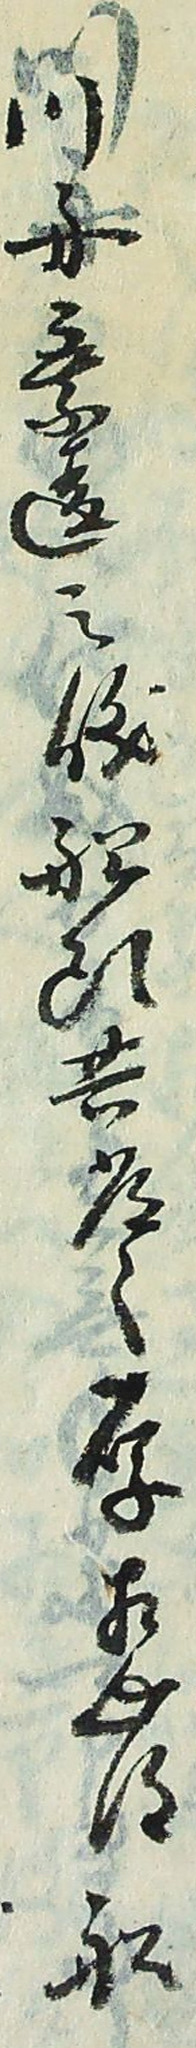川舟乗違之儀船頭共常々厚相心得船
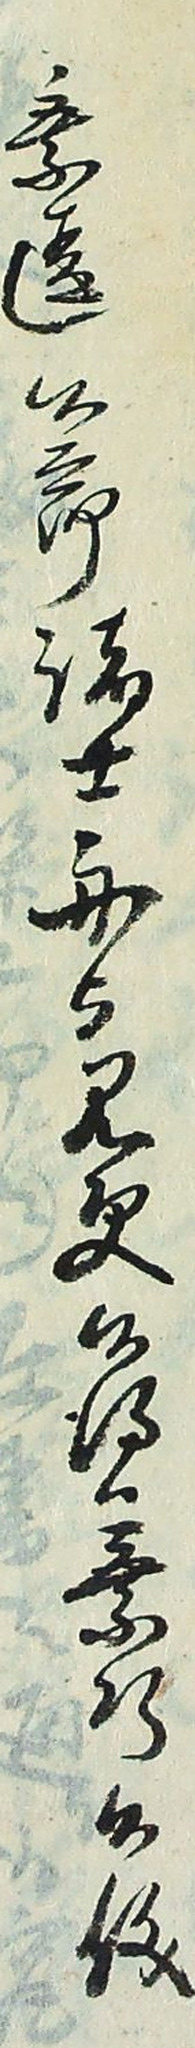乗違候節諸士舟と見受候得は乗行候儀
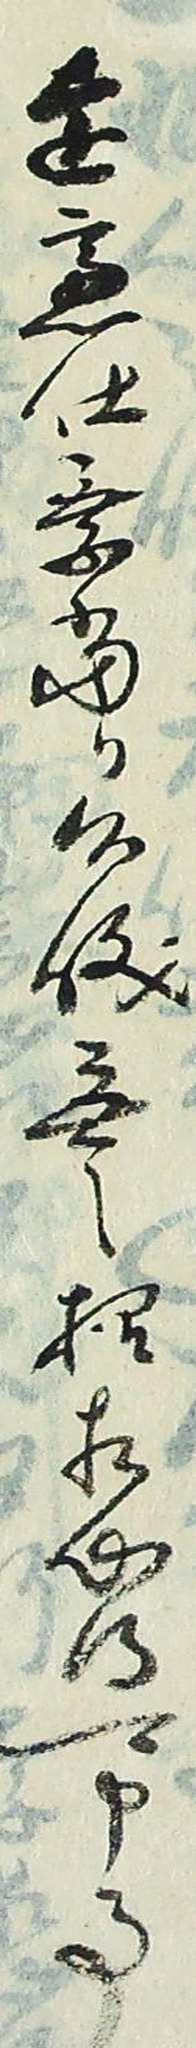遠慮仕乗当り候儀無之様相心得可申事
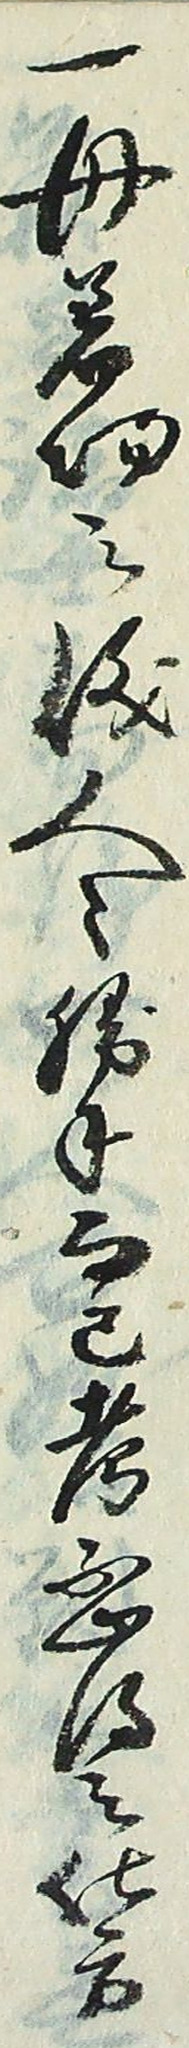一舟着場之儀人々勝手而已考不心得之仕方
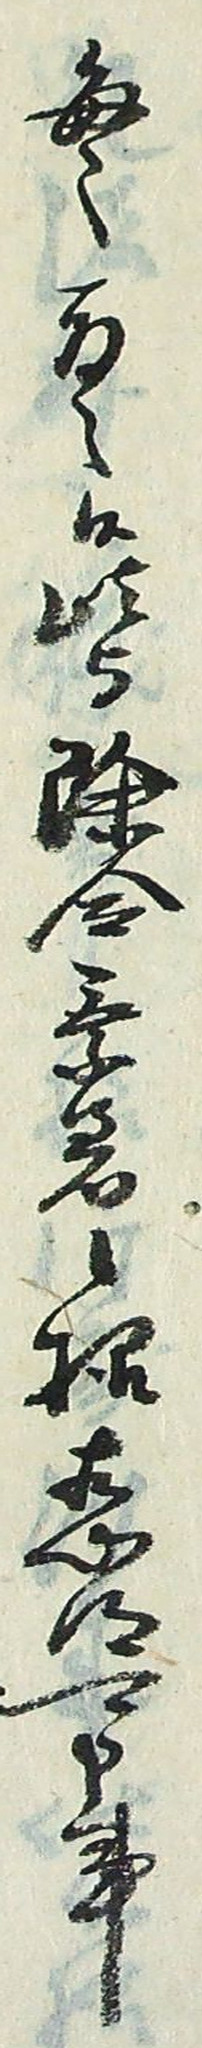毎々有之候屹と除令乗着候様相心得可申事
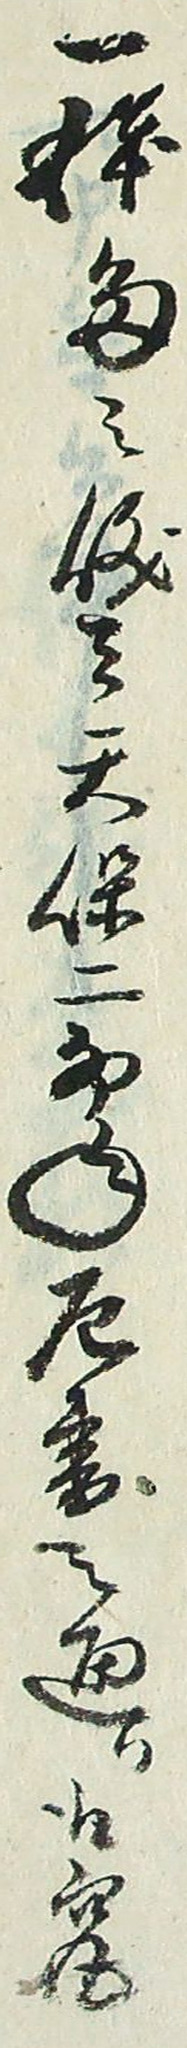一穢多之儀は天保二卯年左書之通り取究
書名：諸御用御□受書控
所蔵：鳴門教育大学 Naruto University of Education
